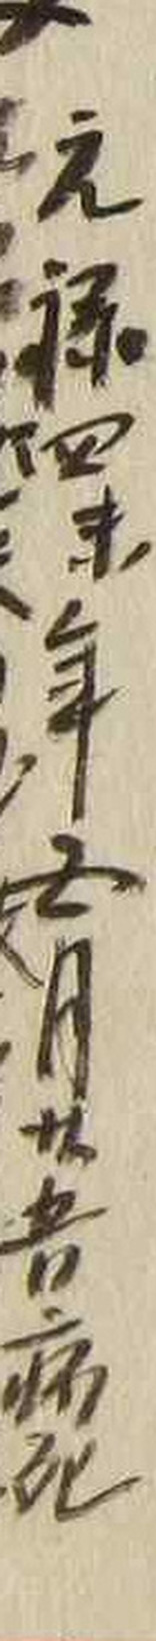元禄四未年五月廿五日病死
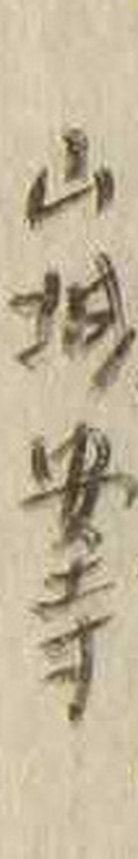山城安寺

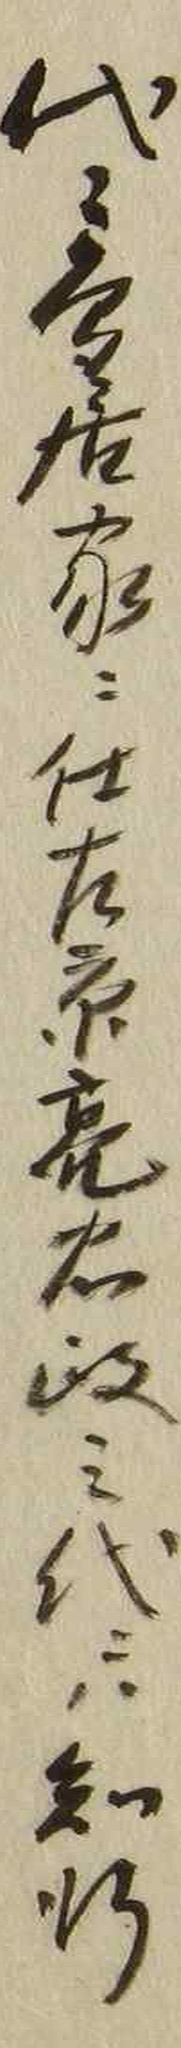代々鳥居家に仕左京忠政之代には知行
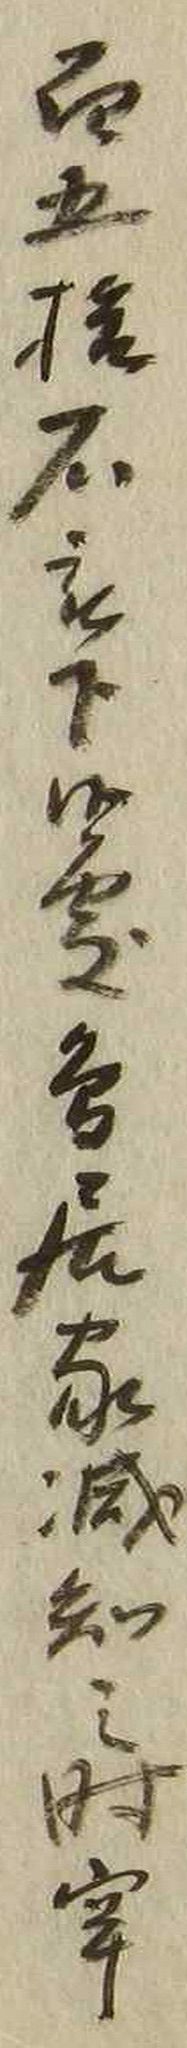百五拾石被下候処鳥居家減知之時牢
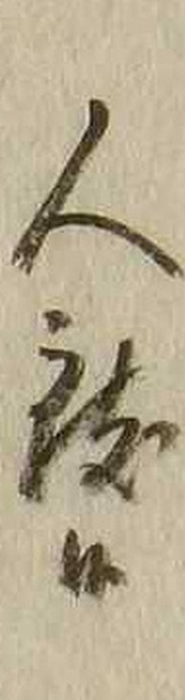人致候
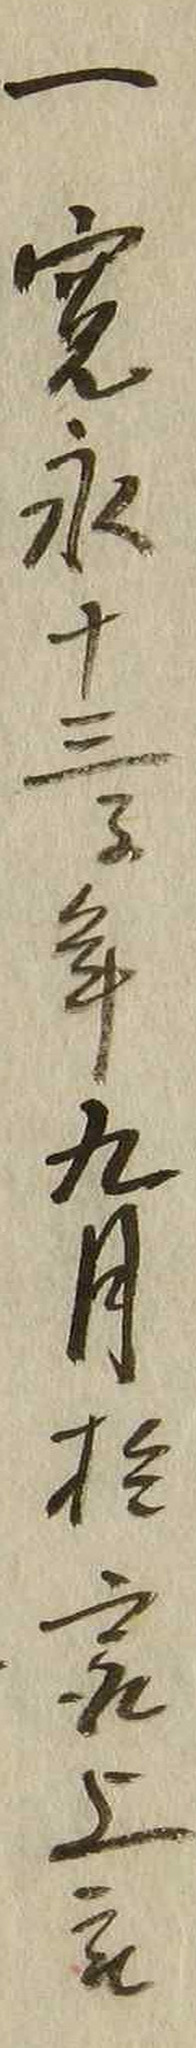一寛永十三子年九月於最上被
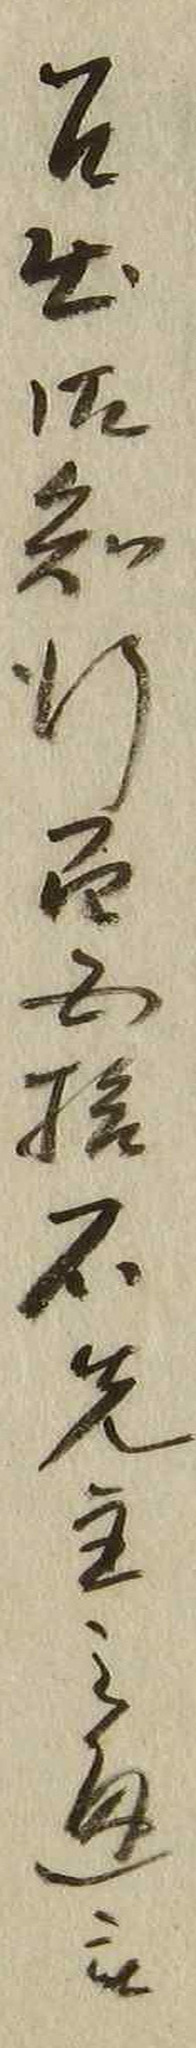召出御知行百五拾石先主之通被
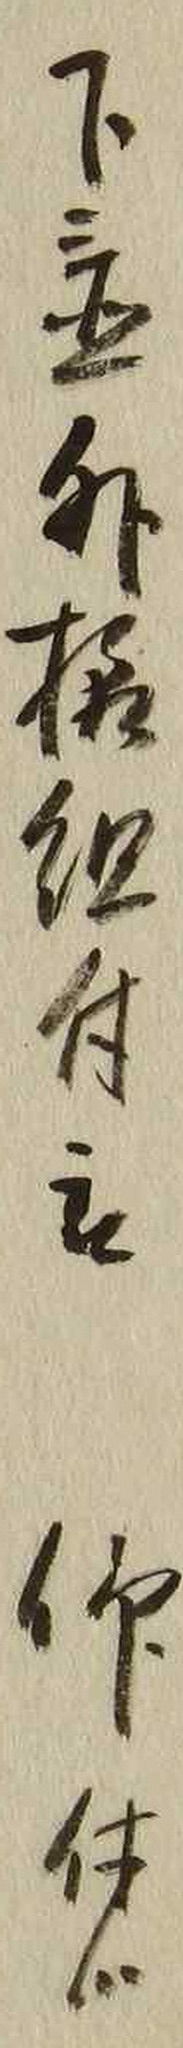下置外様組付被仰付候
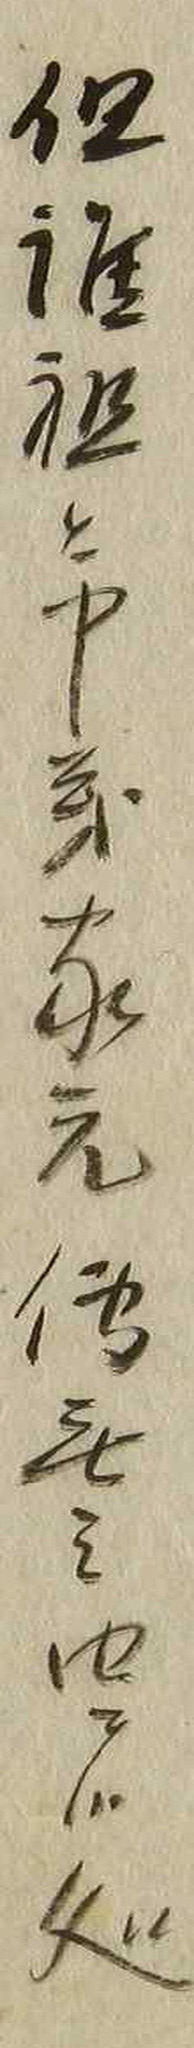但誰祖と申義家元伝無之由に候処
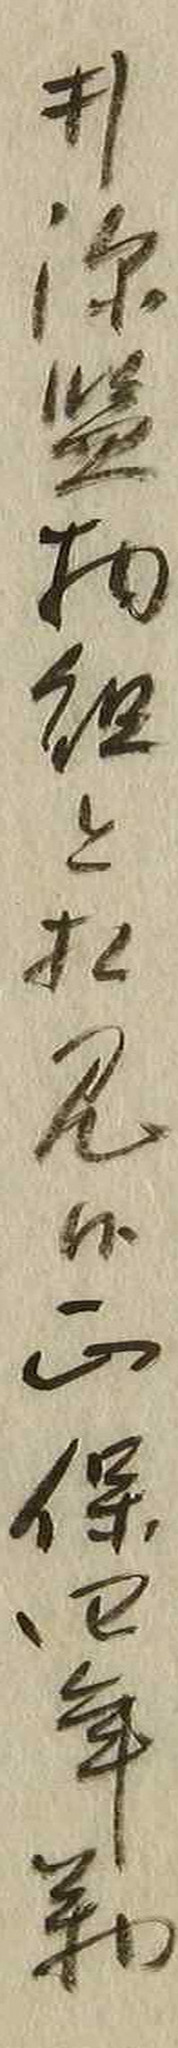井深監物組と相見候正保四年勤
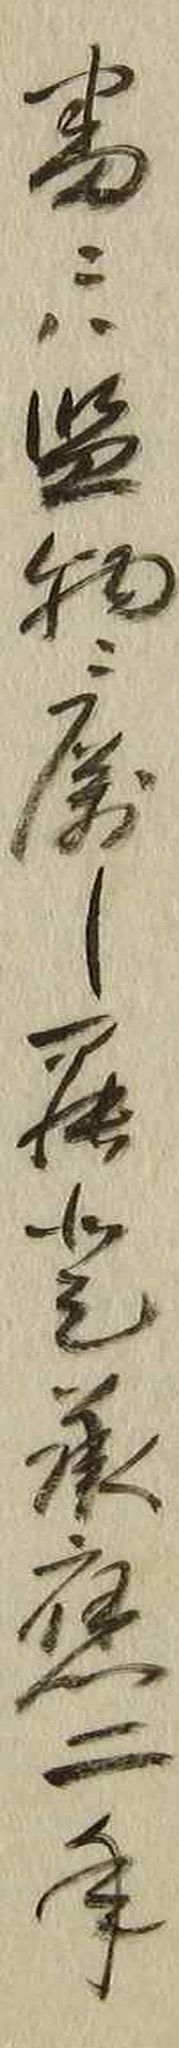番には監物に属し罷登承応二年
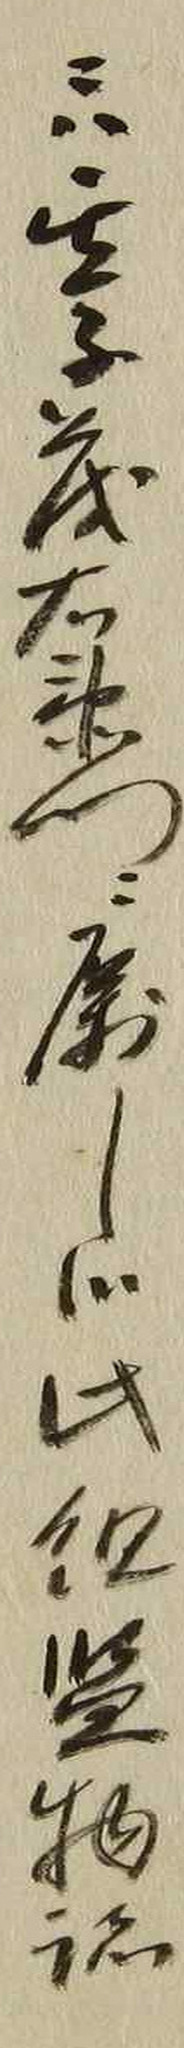には其子茂右衛門に属し候此組監物跡
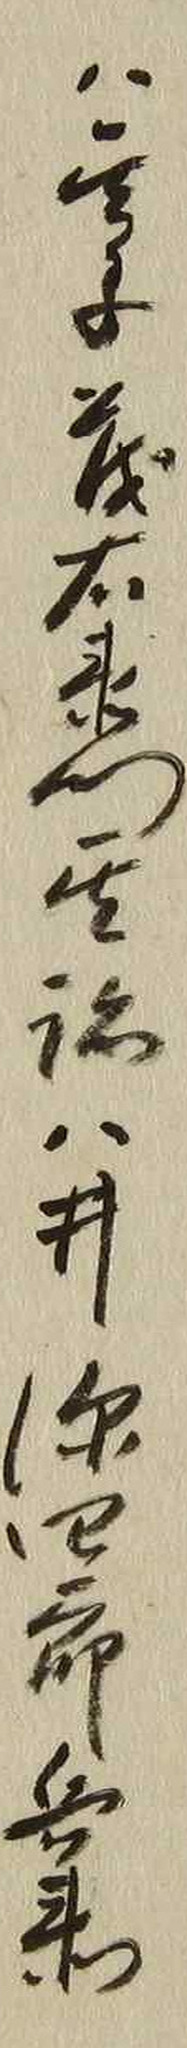は其子茂右衛門其跡は井深四郎兵衛
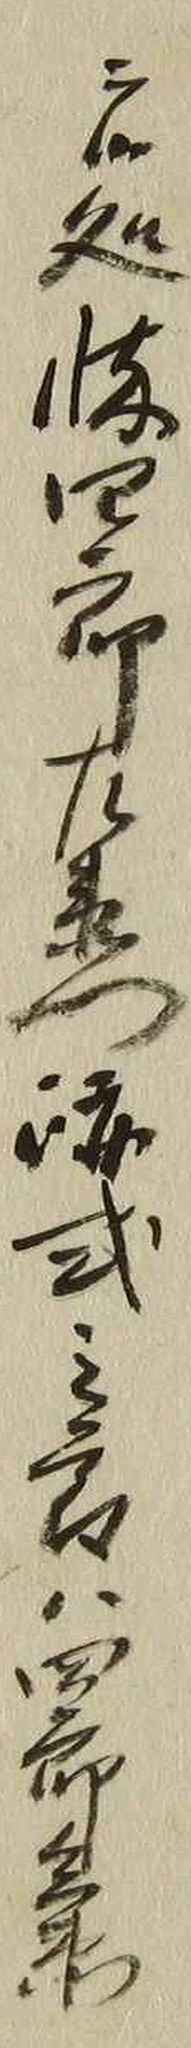に候処忰四郎左衛門跡式之節は四郎兵衛
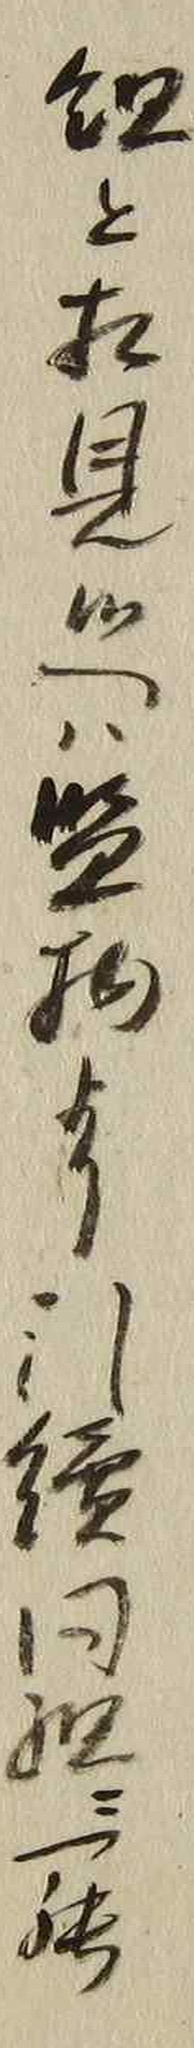組と相見候へは監物より引続同組に罷
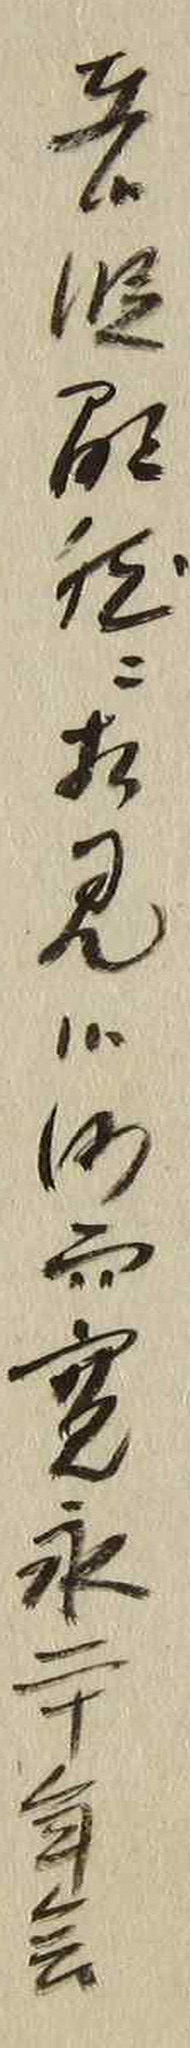在候段顕然に相見候仍而寛永二十年会
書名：諸士系譜　巻之360　す之部10
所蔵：会津若松市立会津図書館
